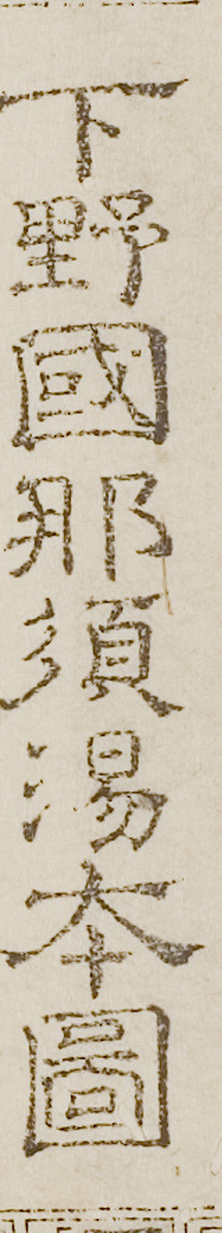下野国那須湯本図
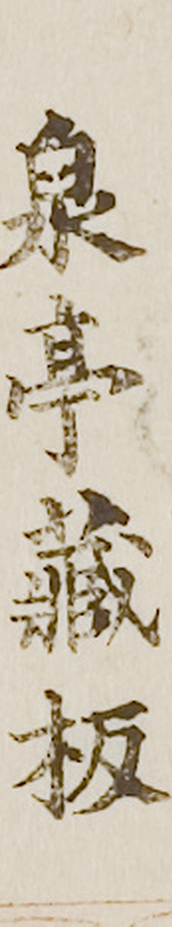泉亭蔵板
